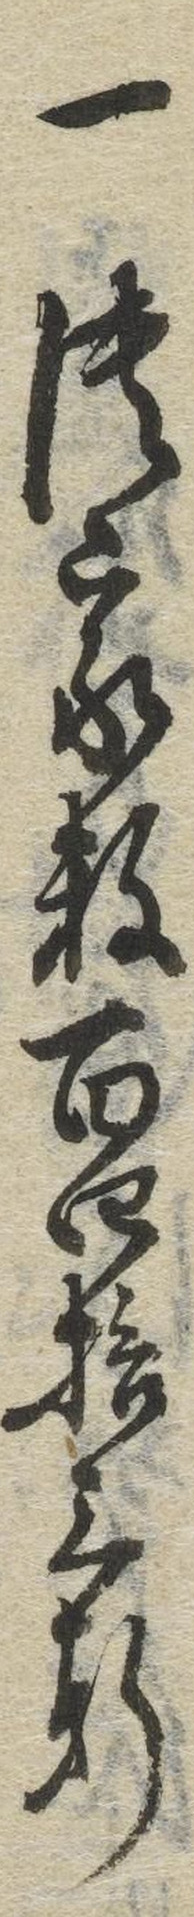一潰家数百五拾四軒
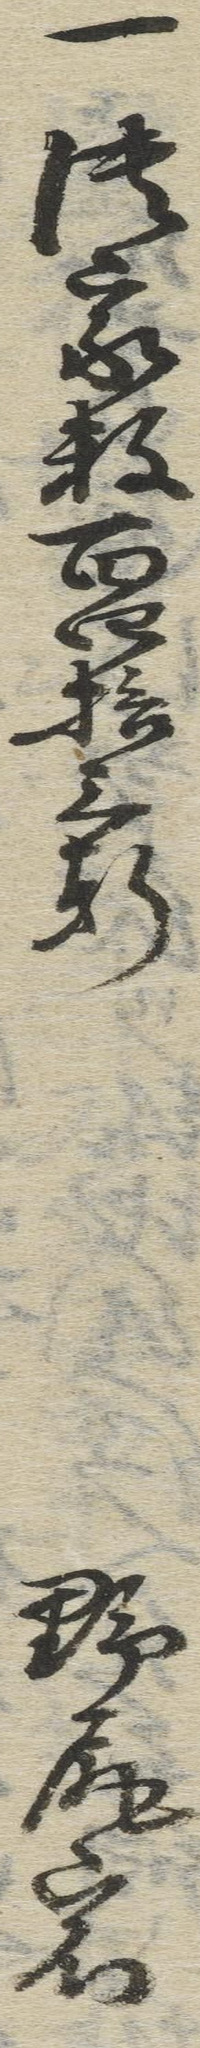一潰家家数百四拾三軒野尻宿
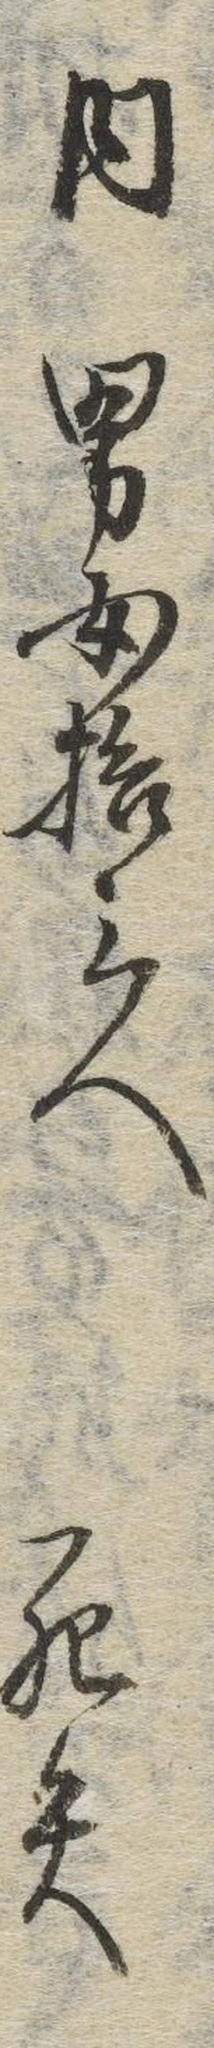内男女拾三人死失
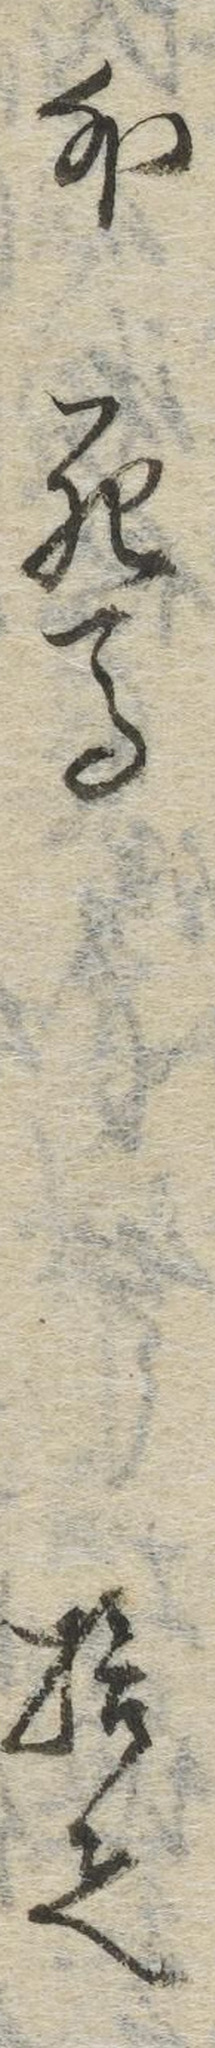外死馬拾疋
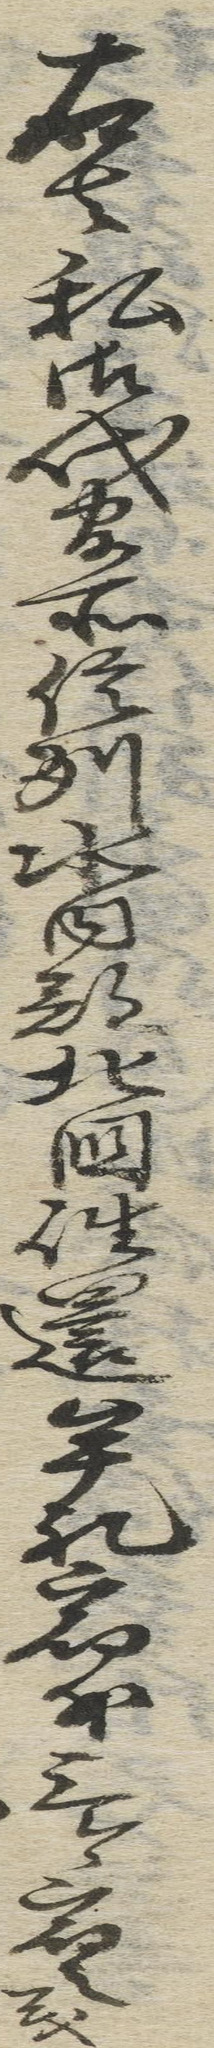右ハ私御代官所信州水内郡北国往還牟礼宿外三ヶ宿之義
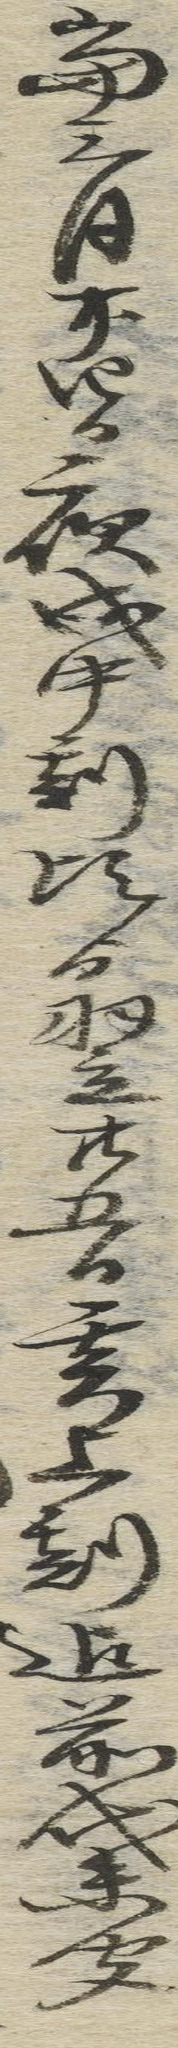当三月廿四日夜戌中刻頃ゟ翌廿五日亥上刻迄前代未聞
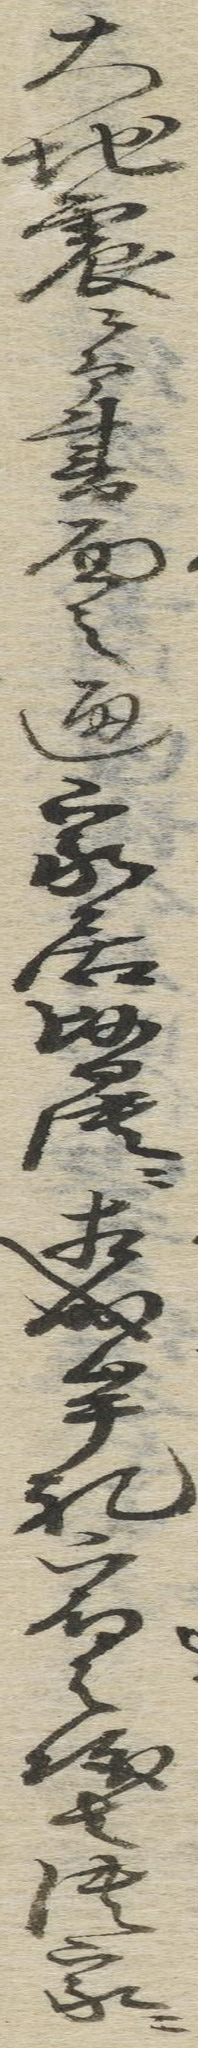大地震二而書面之通家居皆潰二相成牟礼宿之儀ハ潰家二
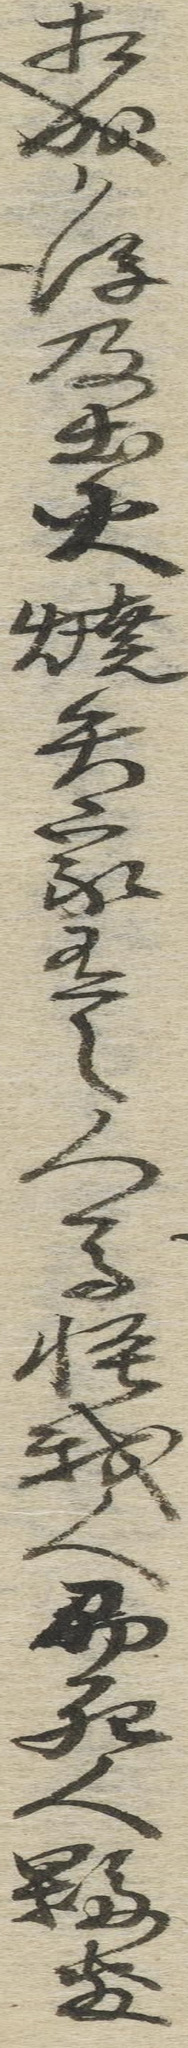相成候後及出火焼失家有之人馬怪我人即死人夥敷
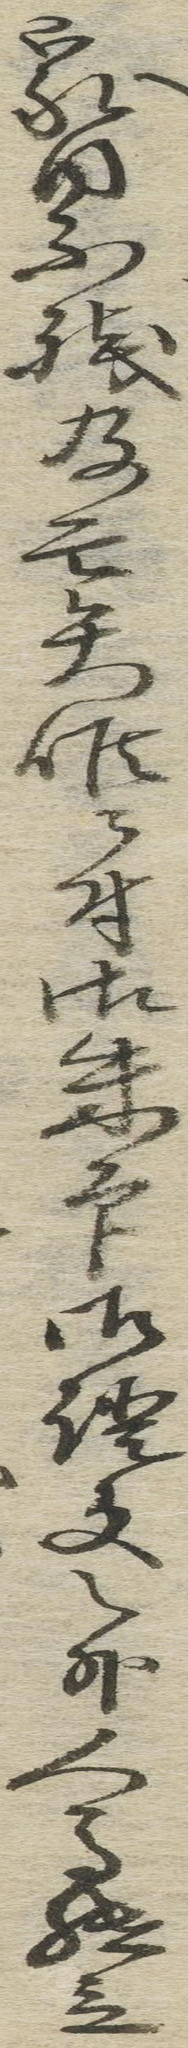宿内不残及亡失候二付御朱印御證文之外人馬継立
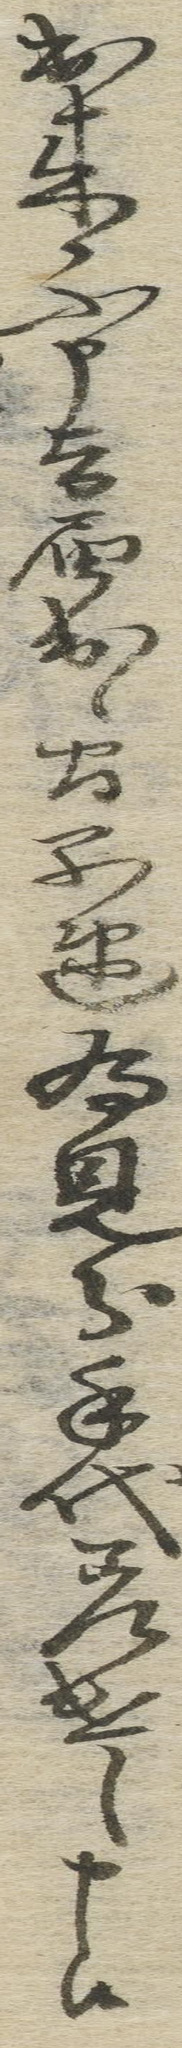出来不申旨届出候間早速為見聞手代差遣し申候
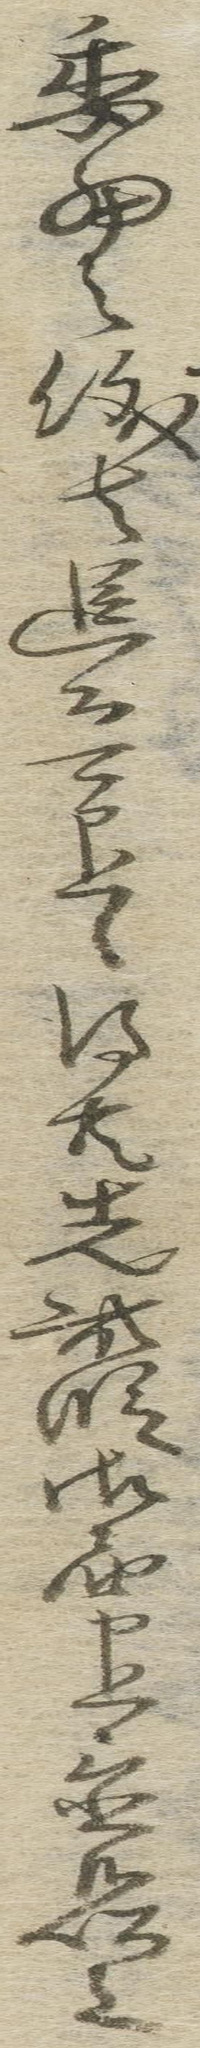委細之儀ハ追而可申上候得共先此段御届申上置候以上

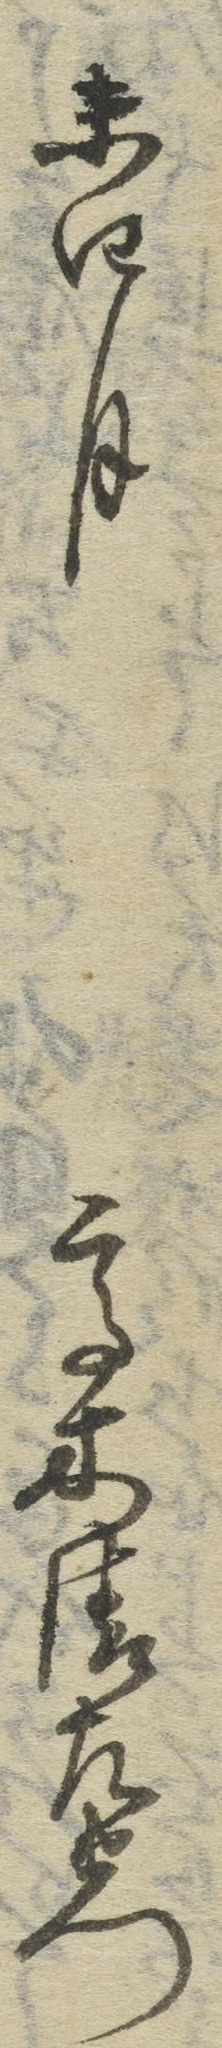未四月高木清左衛門
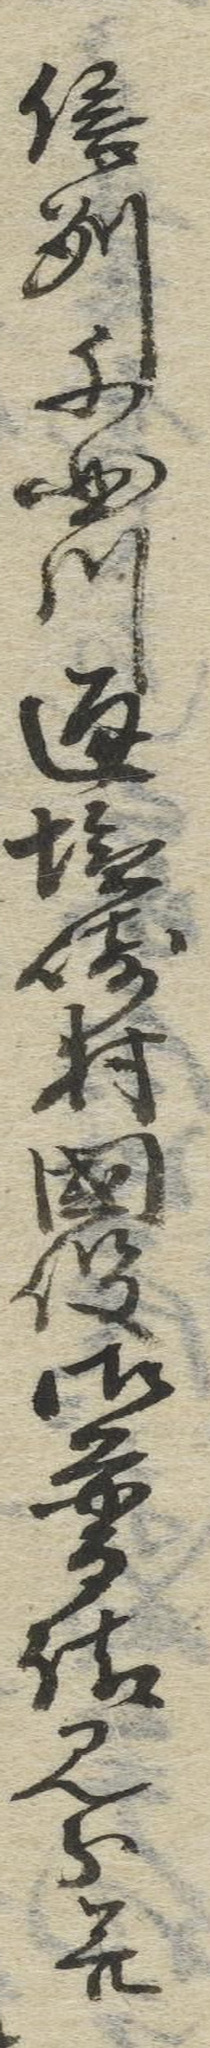信州千曲川通塩崎村国役御普請見分并
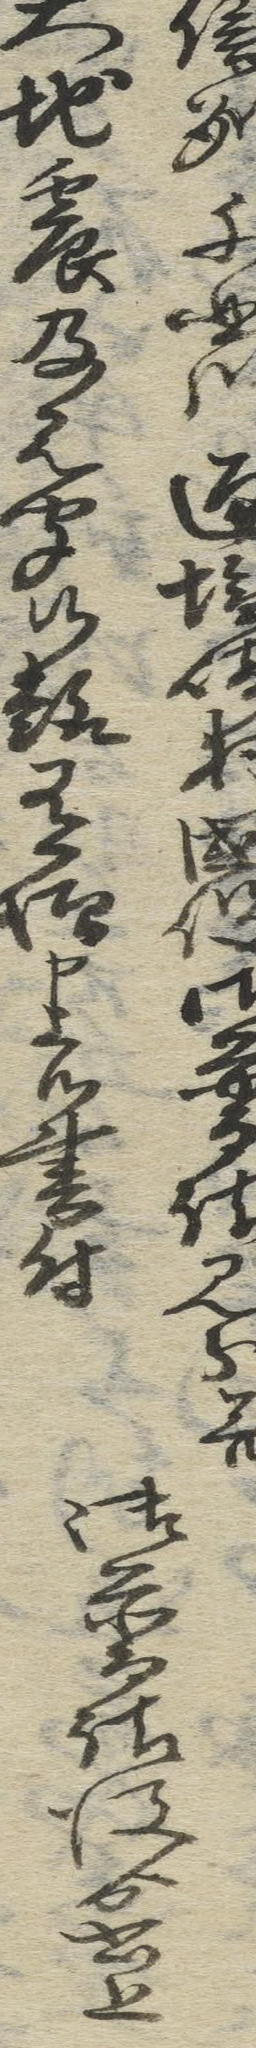大地震及見聞候趣有増申上候書付御普請役ゟ書上
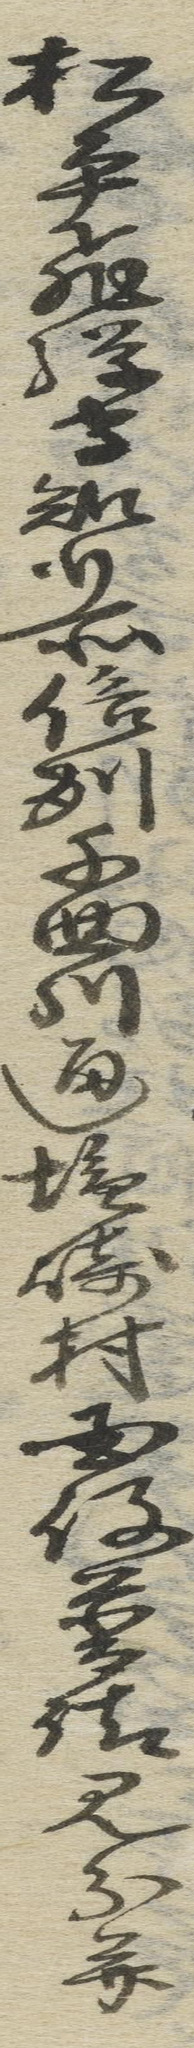松平飛騨守知行所信州千曲川通塩崎村国役普請見分并
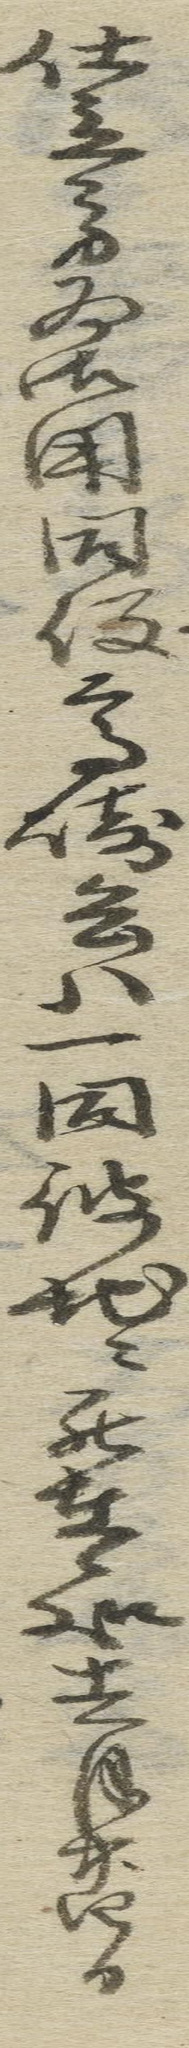仕立方為御用同役高崎善八一同彼地二罷在候所去月廿四日
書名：信濃越後　地震書留
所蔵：東京大学地震研究所図書室 Earthquake Research Institute Library, The University of Tokyo, JAPAN
